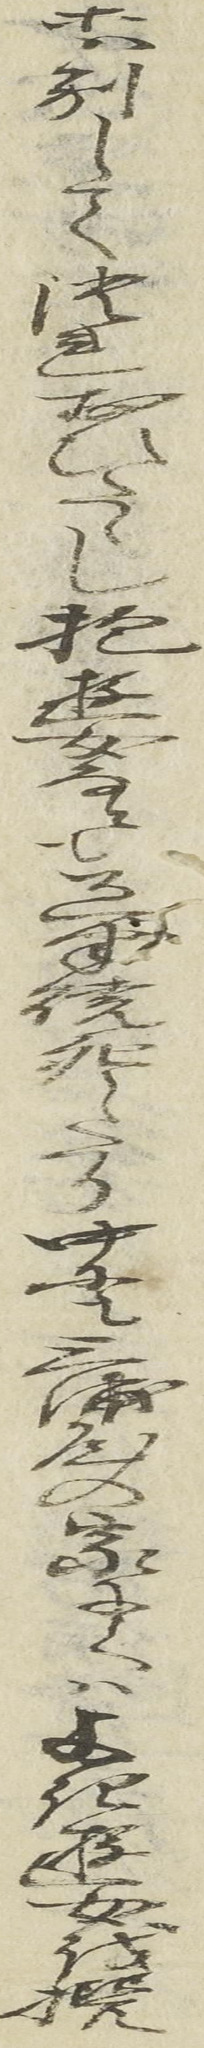等ハ別して潰れおひたゝし抱遊女なとも過半焼死したり中にも三浦屋の家にてハよき遊女を撰
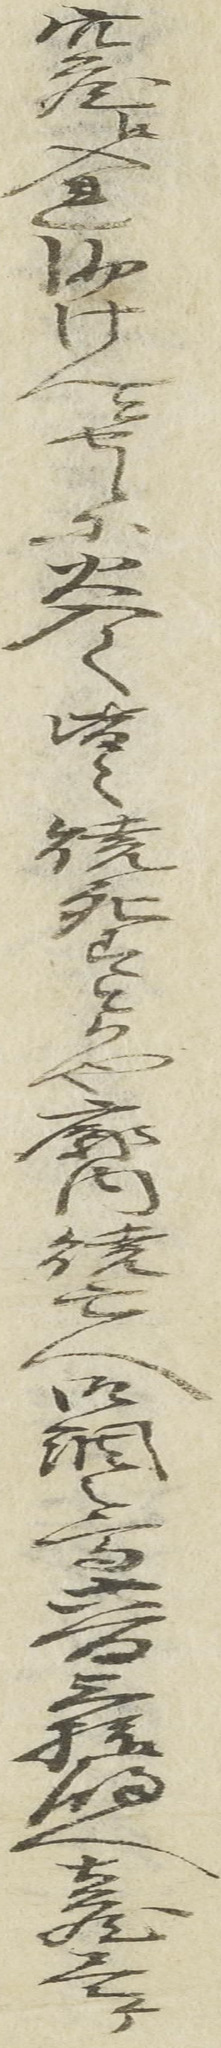穴蔵江入れ助けんとセしに火入て皆〻焼死すとかや廓内焼亡人御調之高六百三拾余人土蔵一ケ
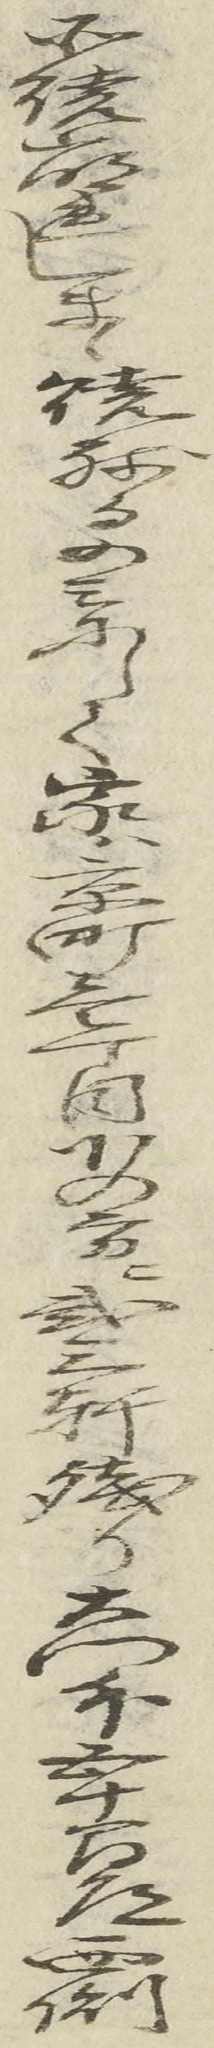所焼崩れしまゝ焼残るのミにして家ハ京町壱丁目下之方ニ弐三軒残り大門外五十間道西側
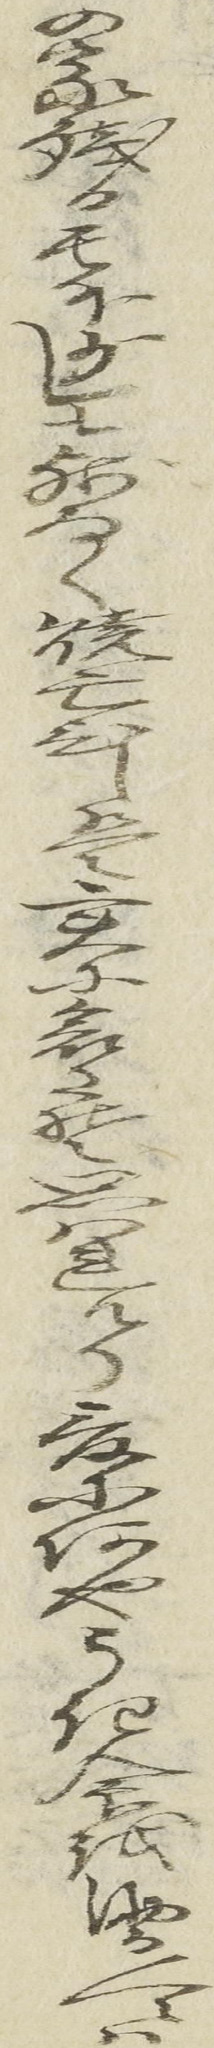の家残る其外少しも残なく焼亡ひしは実に哀こそ思ハれケり爰にあやうき命を助る人〻ハ
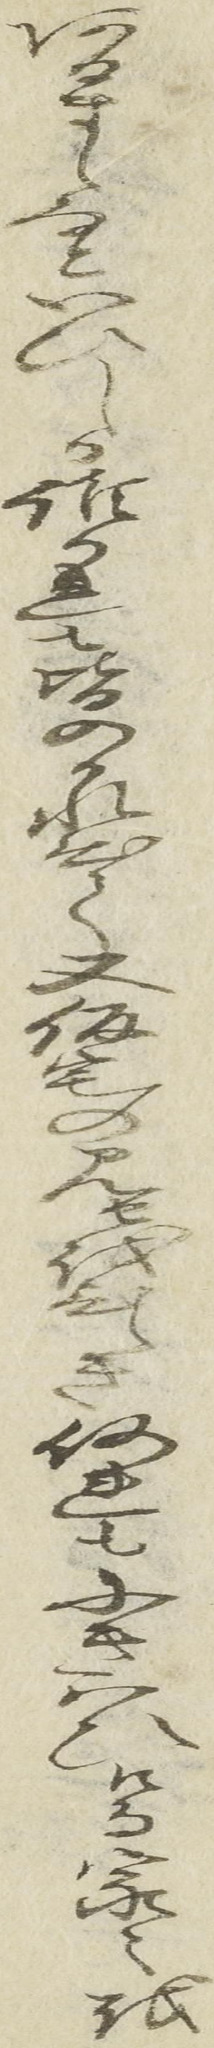あるましなといひしか誰かれも皆のかれ出て又仮宅の見セをひらき何れもにきワひケる家〻を
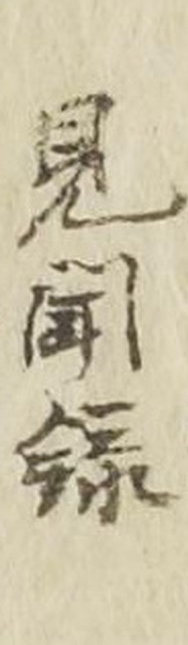見聞録
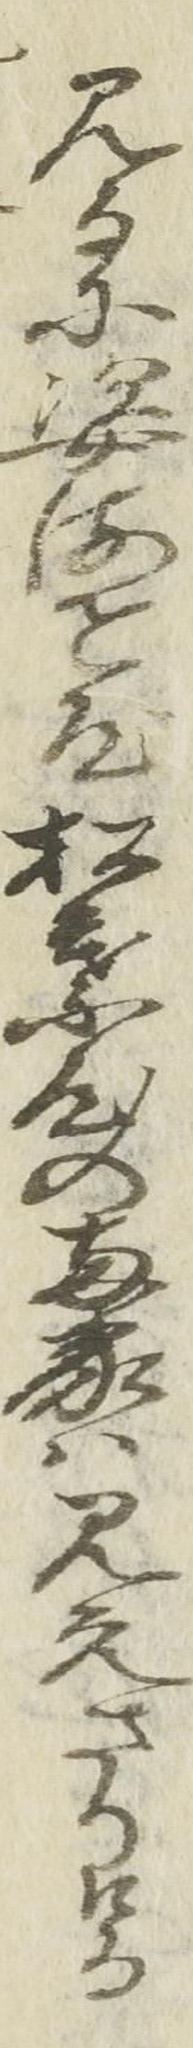見るに姿海世屋松葉屋の両家ハ見えさりケる
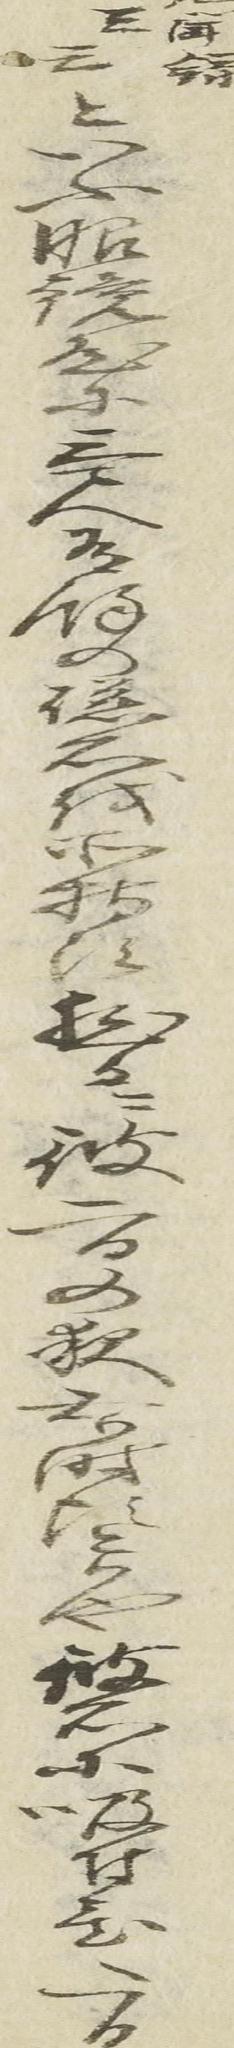一云云といふ眼鏡屋に三尺有余の磁石を所持す然るニ彼二日の夜五ツ時頃とかや彼石に吸付置たる
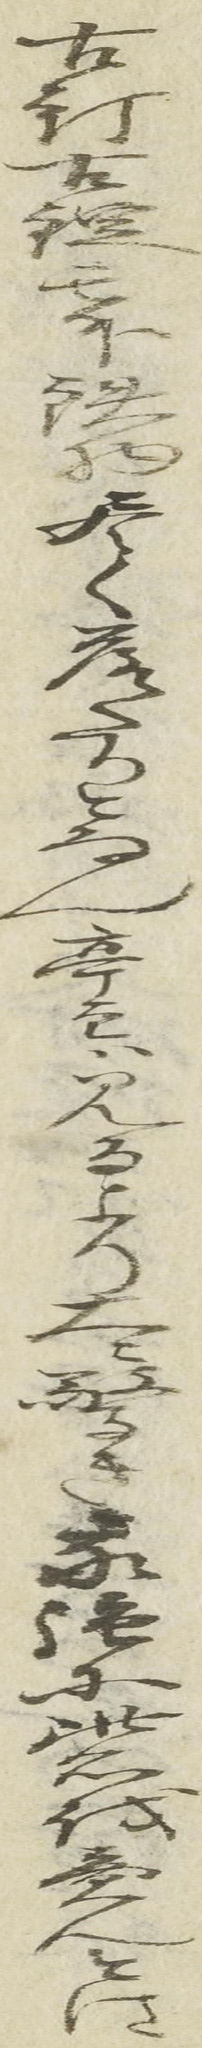古釘古錠其外鉄物尽く落たるとなん亭主ハ見るより大ニ驚き家強に此石を賣んとは
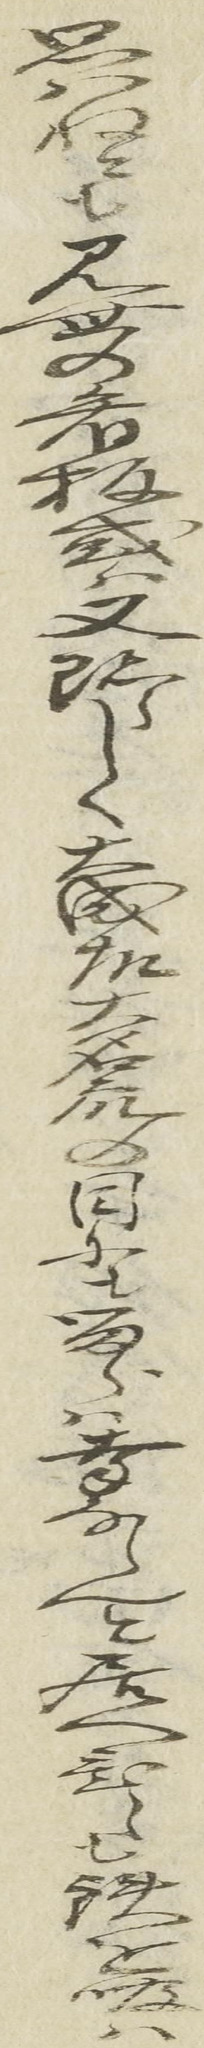思ハねとも見世の看板或ハ又珍しく大成故大名衆の目にも留らハ幸ならんと居へ置しも鉄を吸ハ
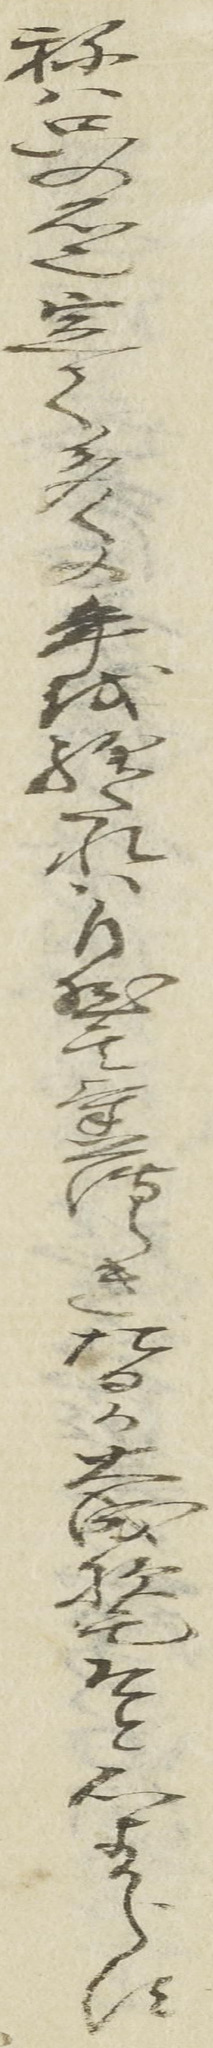ねハ只の石也定て多くの年を経たれハ自然其気薄らきたるか大成損も有と心よからす
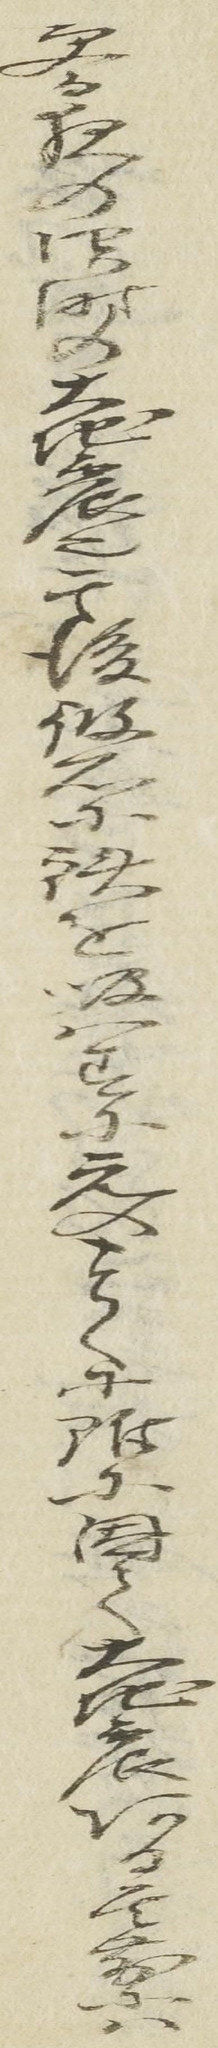更而夜の四ツ時の大地震之其後彼石に鉄を吸ハすに元のことくに附に因て大地震ある其前にハ
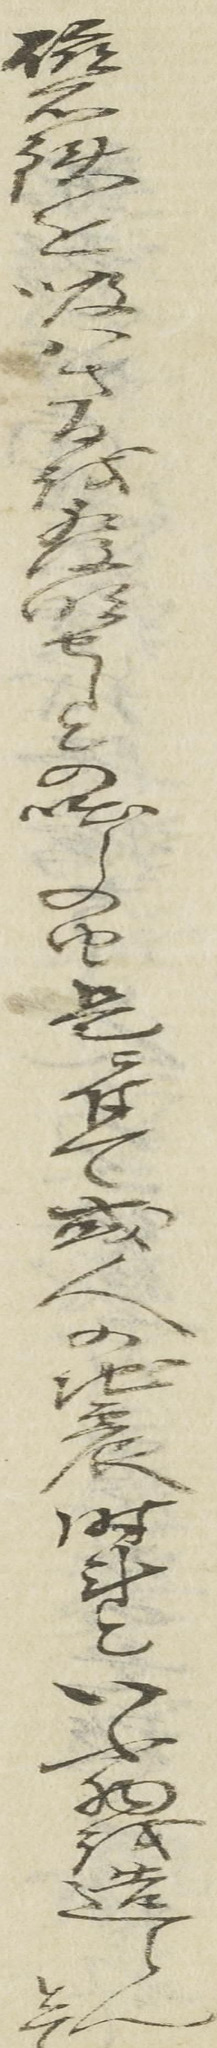磁石鉄を吸ハさるを発明セしとの咄しの由是ニ付て或人の地震時計といふ物を造らんとて
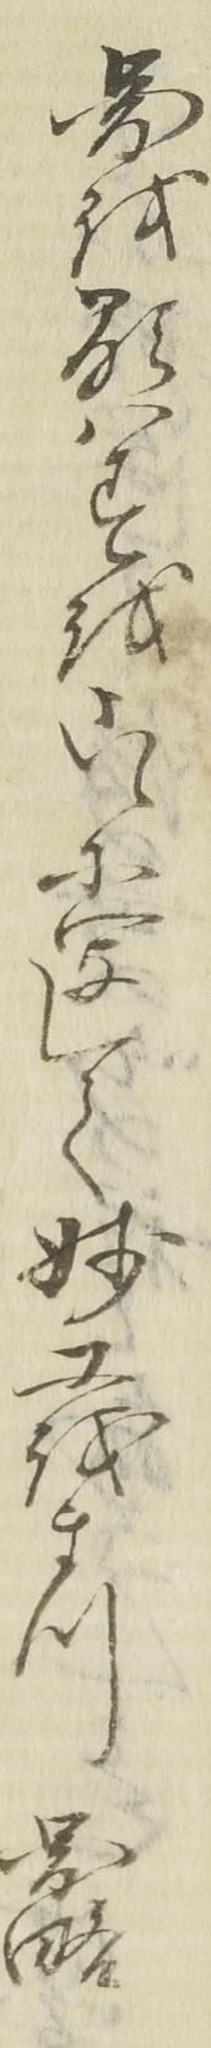図を顕ハすをこゝに写して妙工をまつ図略
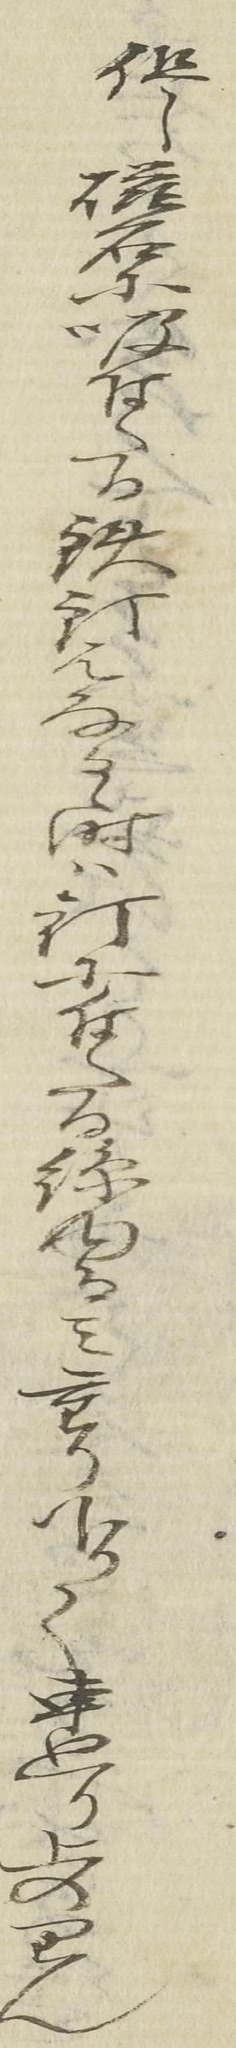但し磁石に吸付たる鉄釘はなるゝ時ハ釘に付たる線ゆるミ重り下りて車廻り上のりん
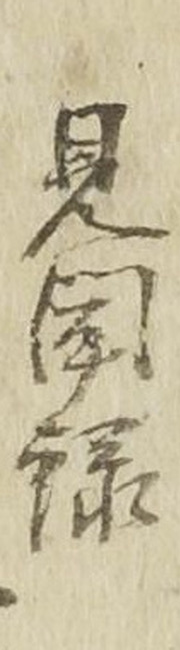見聞録
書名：安政乙卯江戸大地震筆記　安政丙辰八月大阪大雷雨之記追加　安政三辰年七月松前辺大地震并八月大風雨記録
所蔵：東京大学地震研究所図書室 Earthquake Research Institute Library, The University of Tokyo, JAPAN
